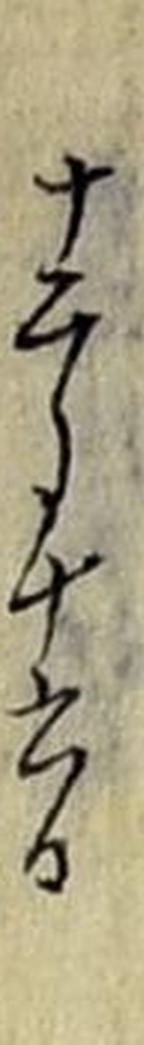十二月十六日
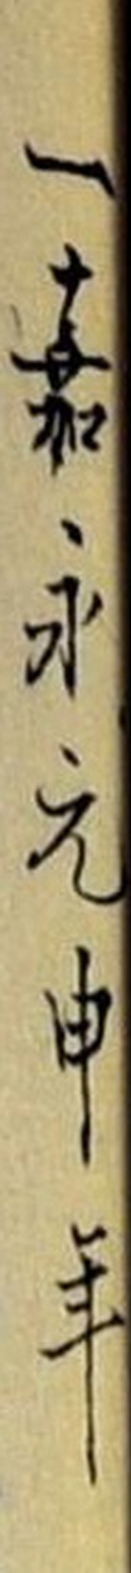一嘉永元申年
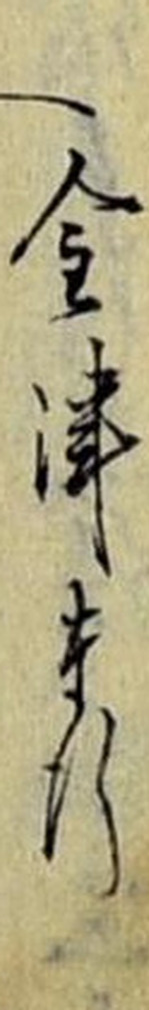金津奉行
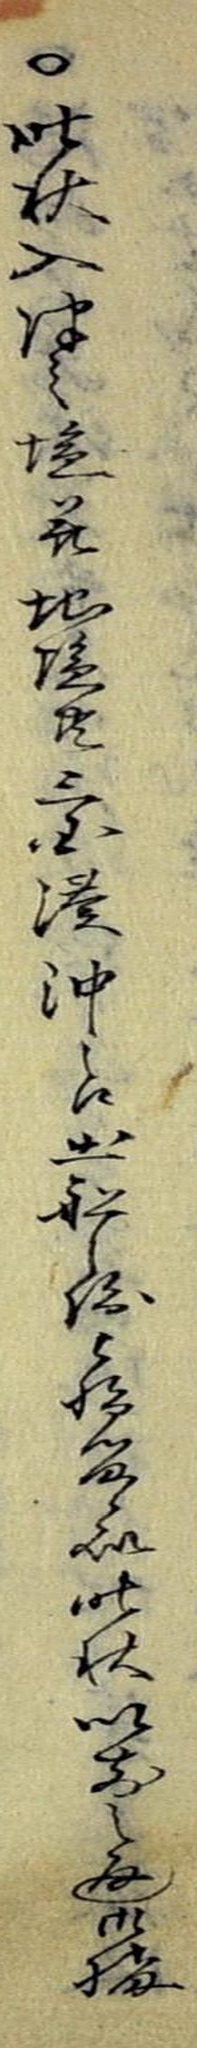○昨秋入津之塩并地塩共三国湊沖之口出船之儀被指留候処昨秋以前之通御構
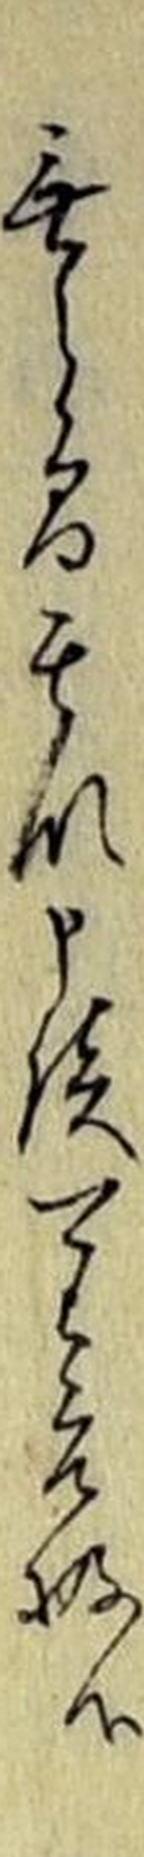無之候間其段申段可被取扱候
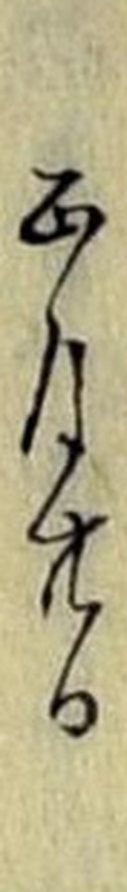正月廿日
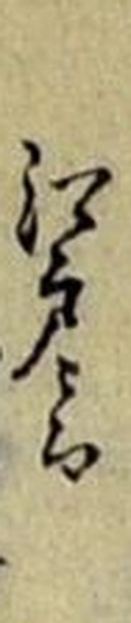江戸に而
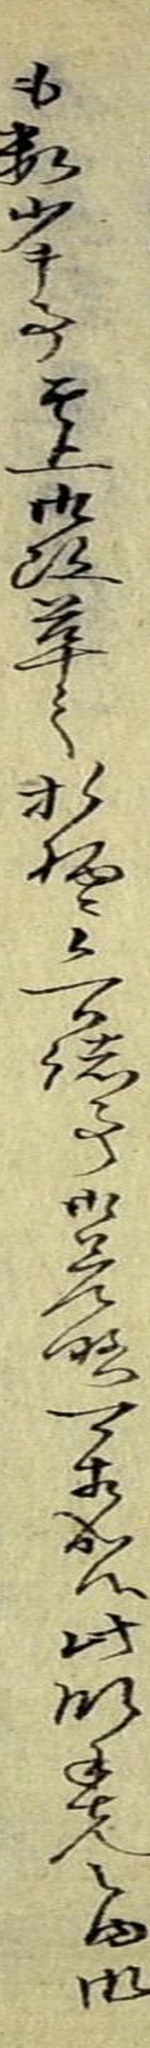も数少キ事其上御改革之折柄に候へは諸事御差略可相成候此段手先之内御
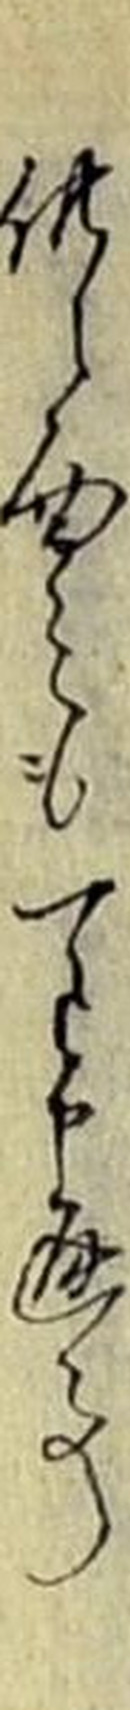供之面々へも可被申通事
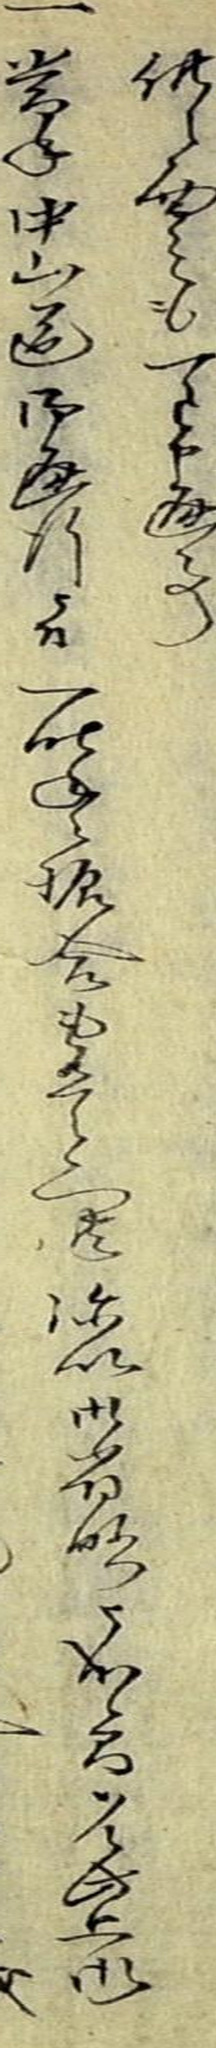一当年中山道御通行に付一昨年之振合も有之候へ共弥以御省略被成候間乍此上御
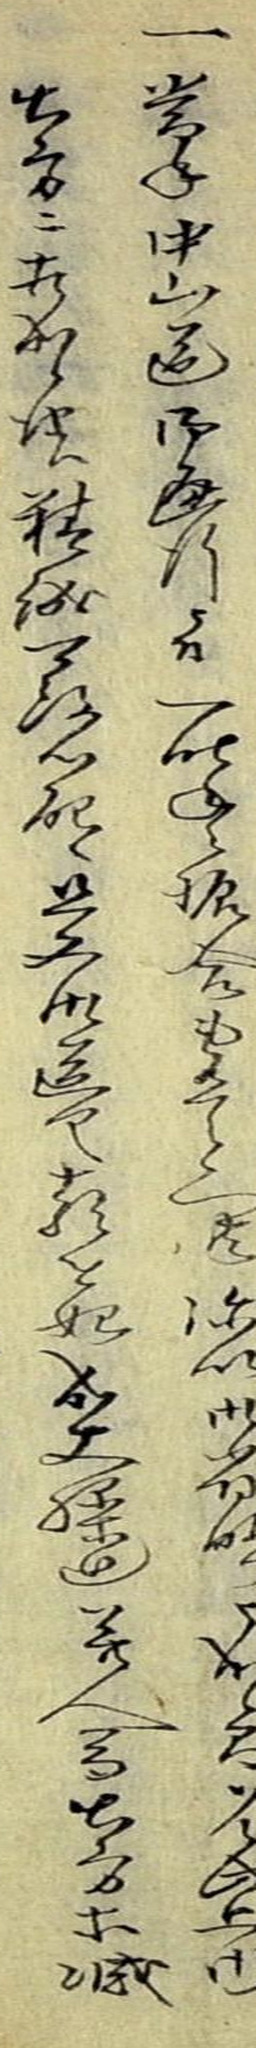出方に相成候儀は精誠可致心配候且又御道具類を始成丈繰廻并人馬出方等減
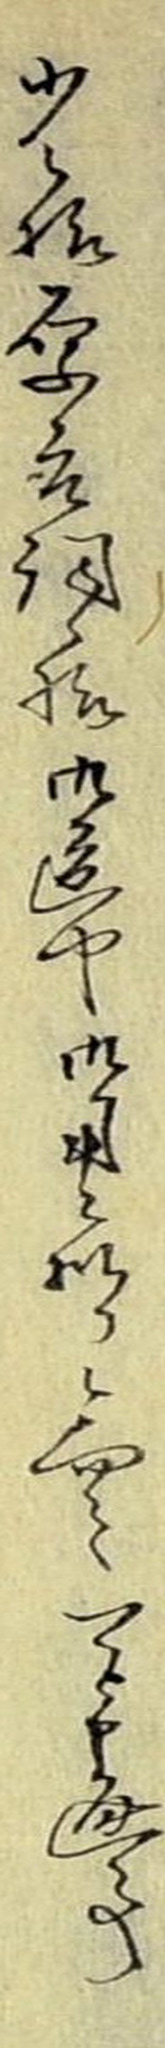少候様厚取調御道中御用に掛り候向々可被申通事
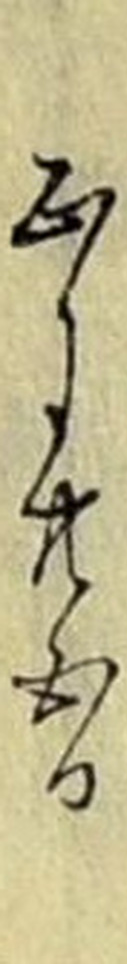正月廿五日
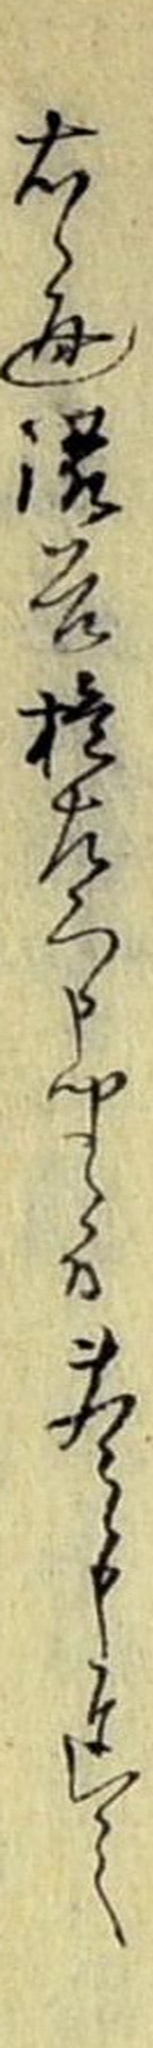右之通渋谷権左衛門申聞候に付夫々申達之

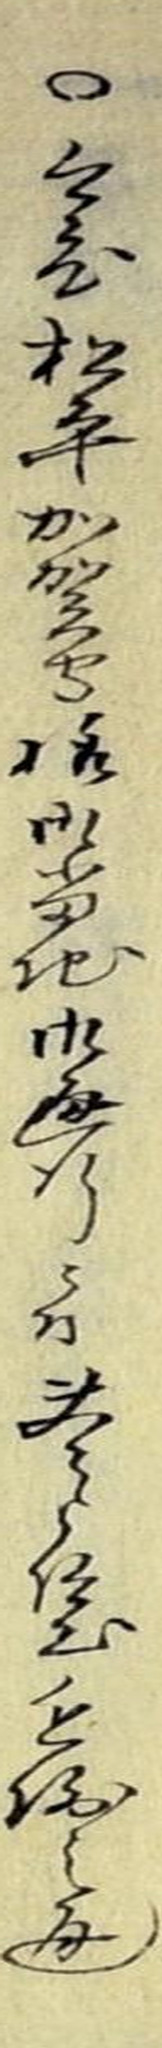○今度松平加賀主様御当地御通行に付夫々被仰出近例之通
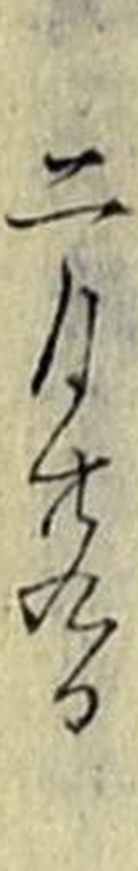二月廿九日
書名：命令之部 六
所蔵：福井県文書館 Fukui Prefectural Archives
